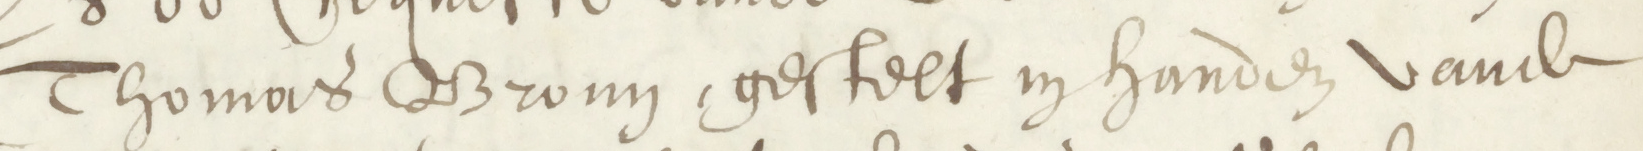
Thomas Broun, gestelt in handen vande
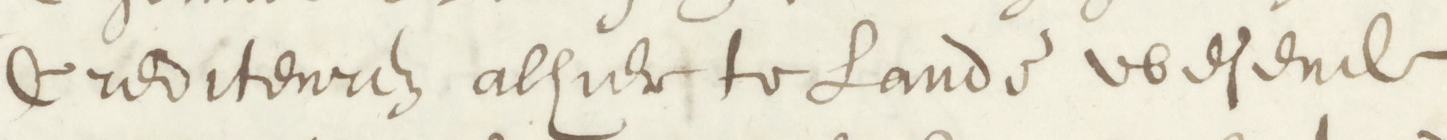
crediteuren alhier te Lande wesende
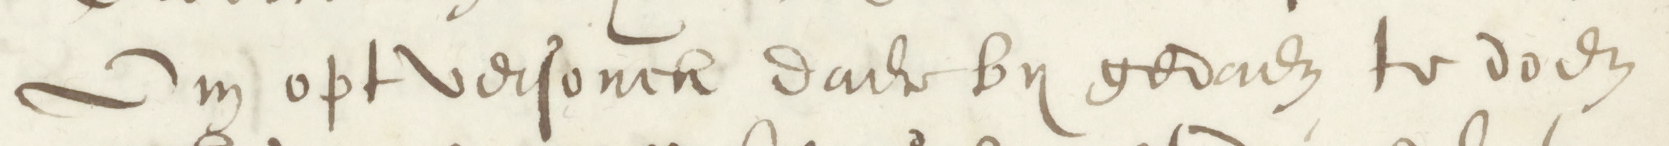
Om opt versouck daer by gedaen te doen
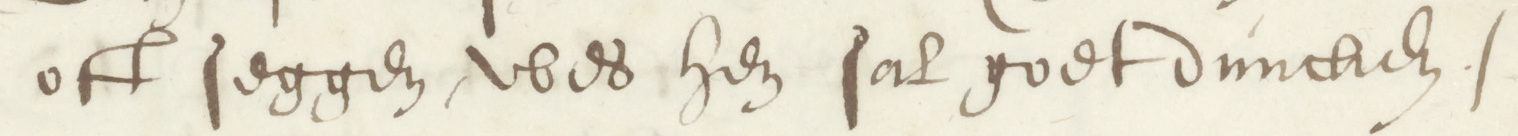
off seggen, wes hen sal goetduncken.
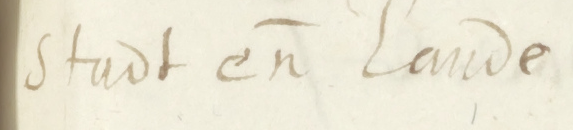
Stadt en Lande
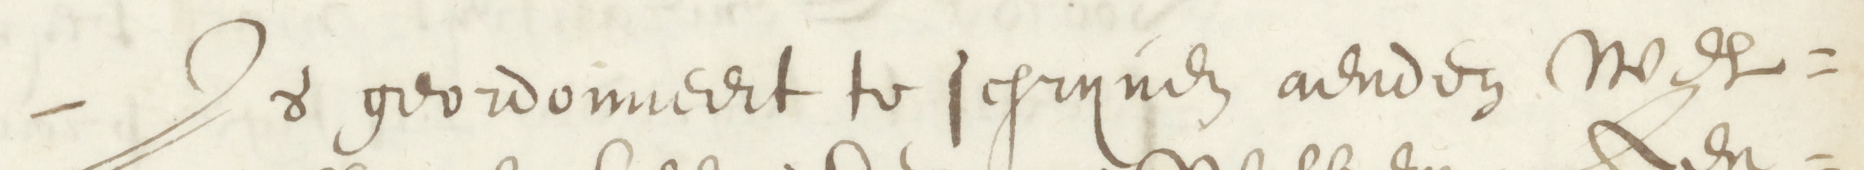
Is geordonneert te schryuen aenden Wel=
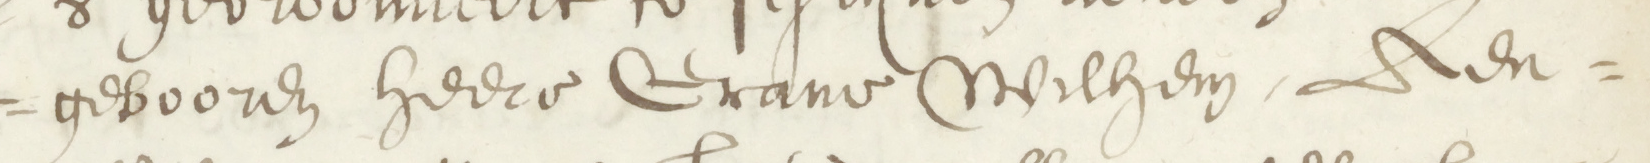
gebooren heere Graue Wilhem, Aen=
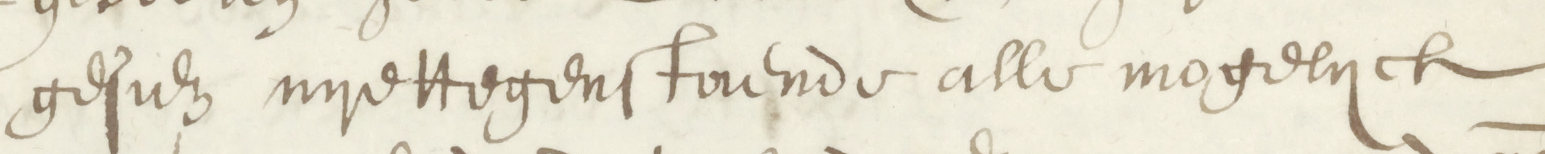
gesien nyettegenstaende alle mogelijck
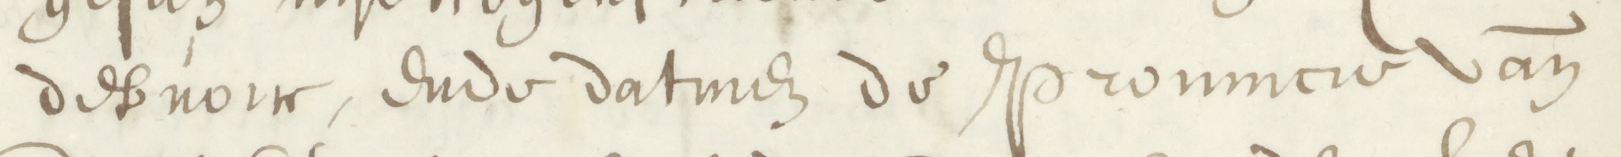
debuoir, ende datmen de Prouincie van
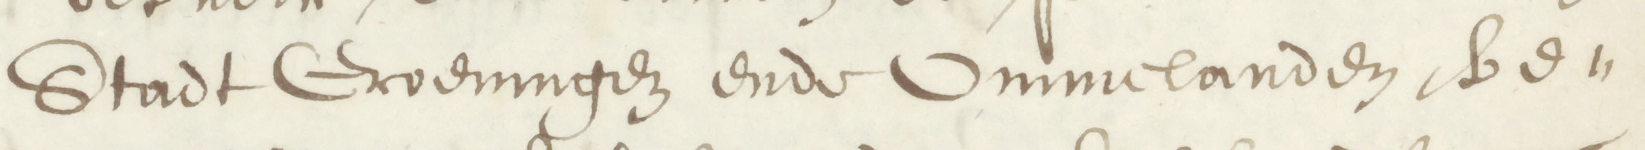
Stadt Groeningen ende Ommelanden, be„
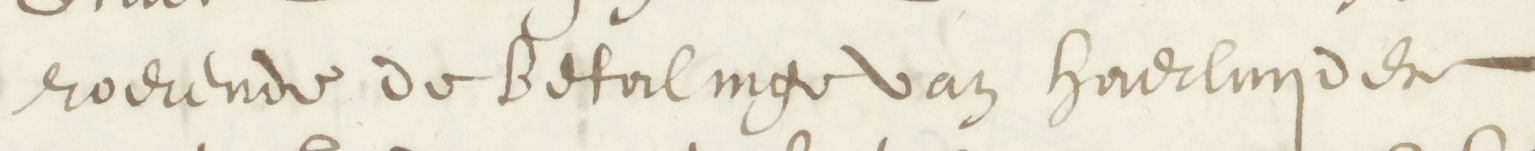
roerende de betalinge van haerluyder
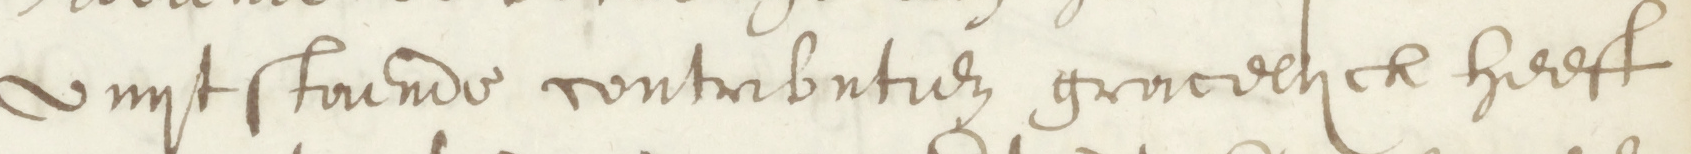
vuytstaende contributien gracelyck heeft
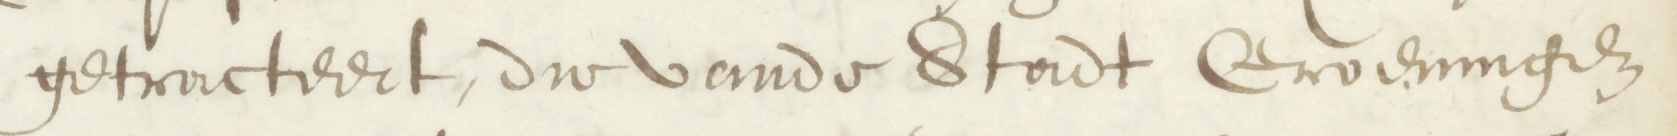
getracteert, die vande Stadt Groeningen
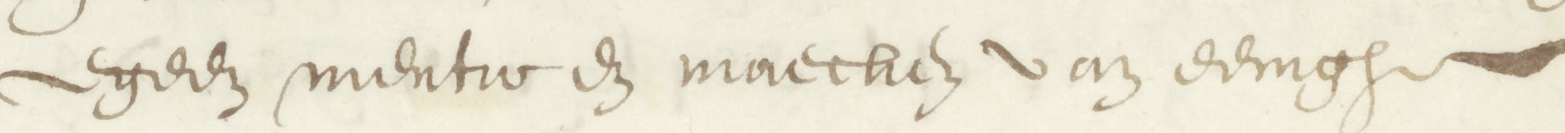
egeen mentio en maecken van eenighe
